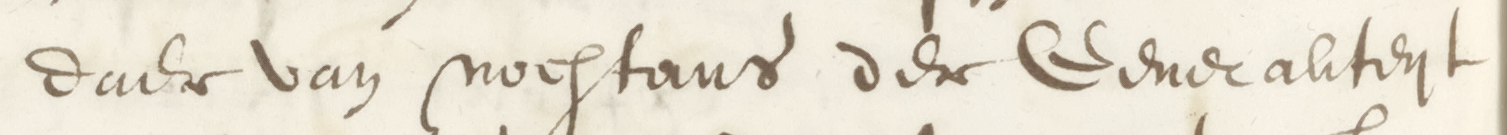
daer van nochtans der Generaliteyt
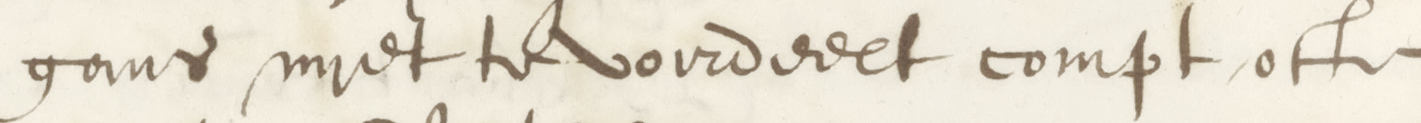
gans nyet te voirdeelt compt, ofte
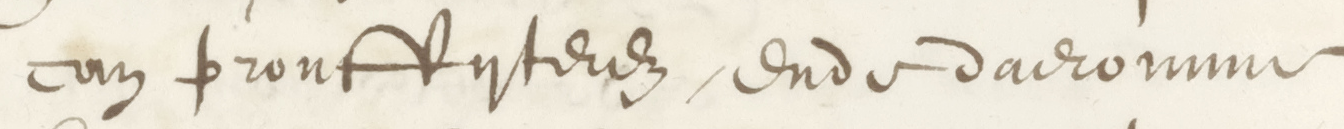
can prouffyteren, ende daeromme
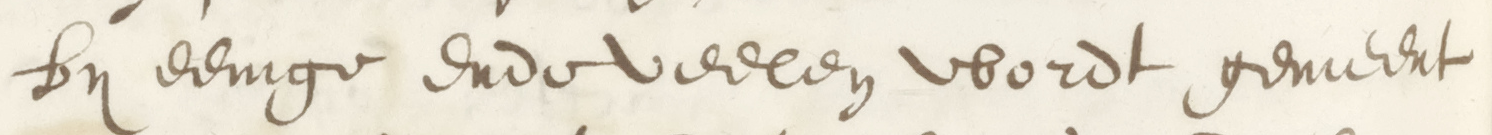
by eenige ende veelen wordt gemeent
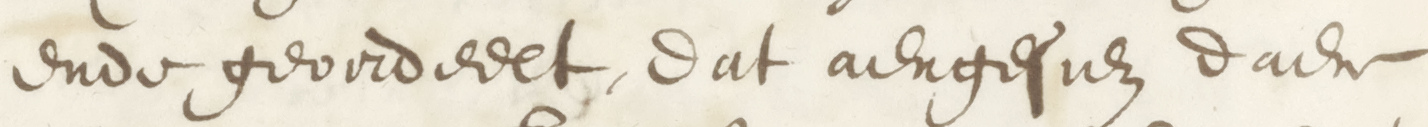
ende geoirdeelt, dat aengesien daer
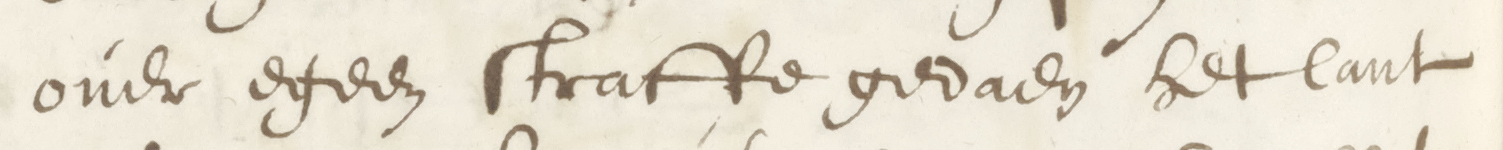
ouer egeen straffe gedaen het lant
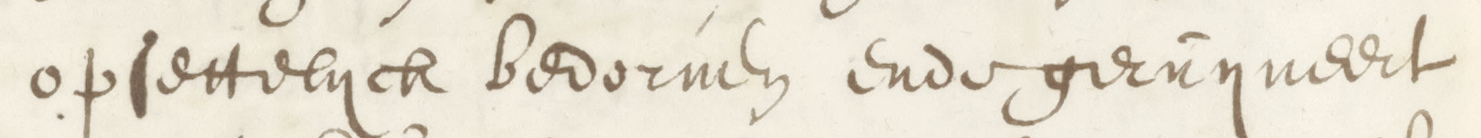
opsettelyck bedoruen ende geruyneert
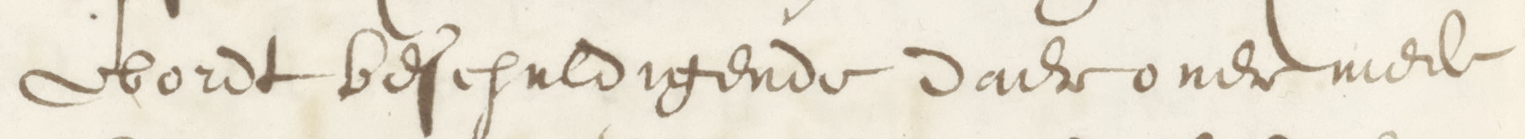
wordt beschuldigende daer ouer mede
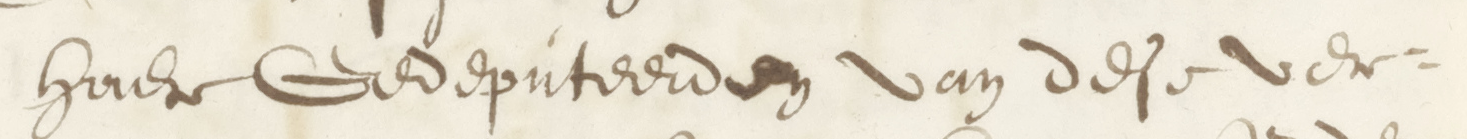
haer Gedeputeerden van dese ver„
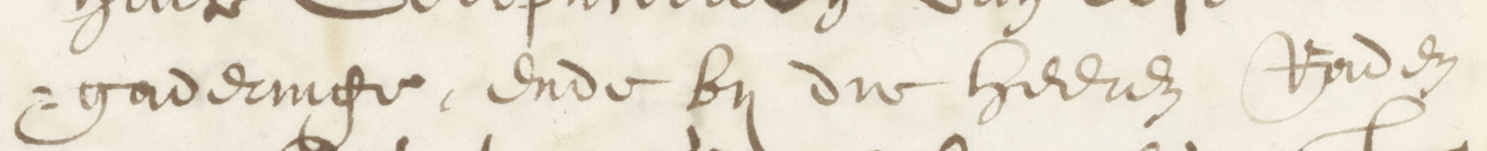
„gaderinge, ende by die heeren Raden
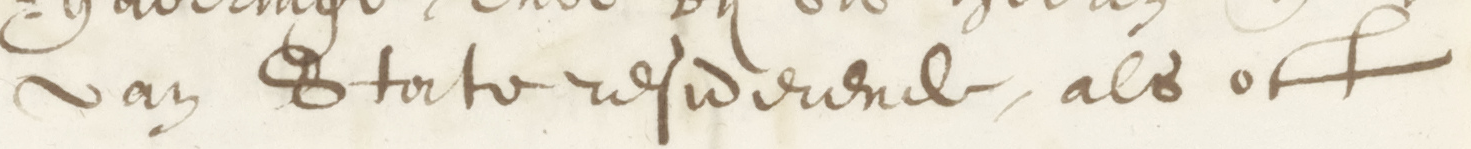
van State residerende, als off
